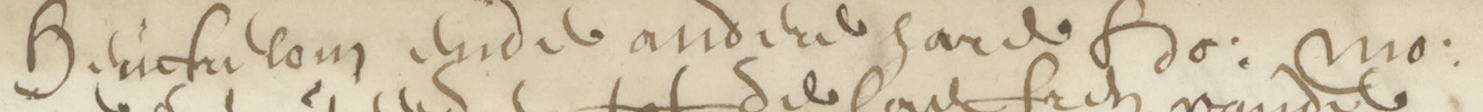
Heuckelom ende andere hare Ho:Mo:
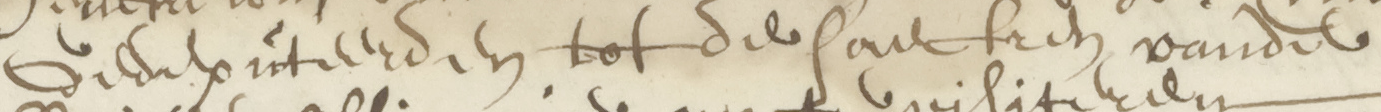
Gedeputeerden tot de saecken vande
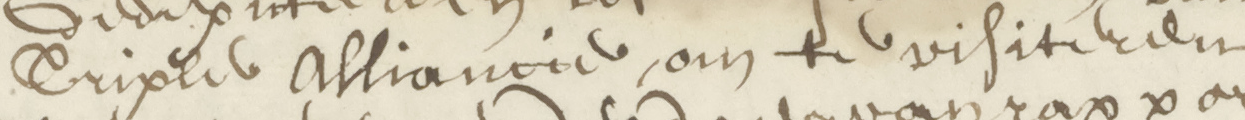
Triple Alliancie, om te visiteren,
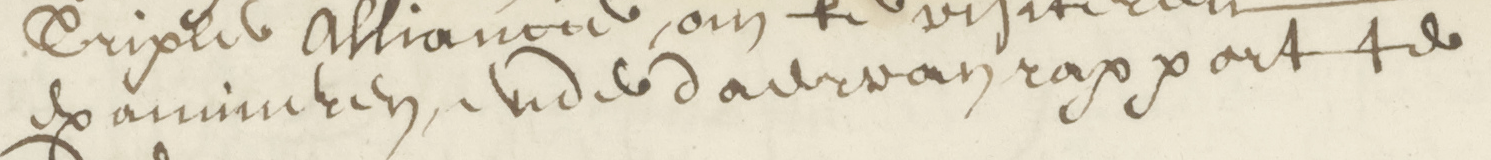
examineren, ende daervan rapport te
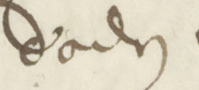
doen.
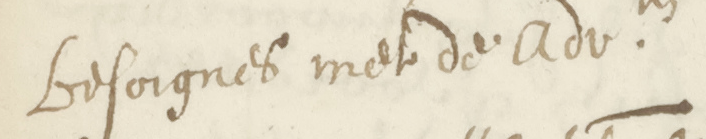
besoignes met de Advten.
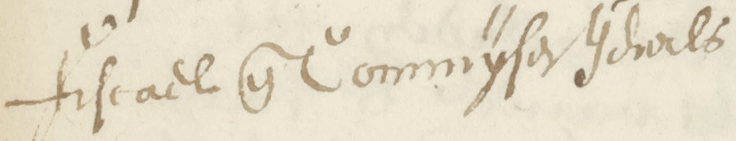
Fiscael & Commijsen Genals
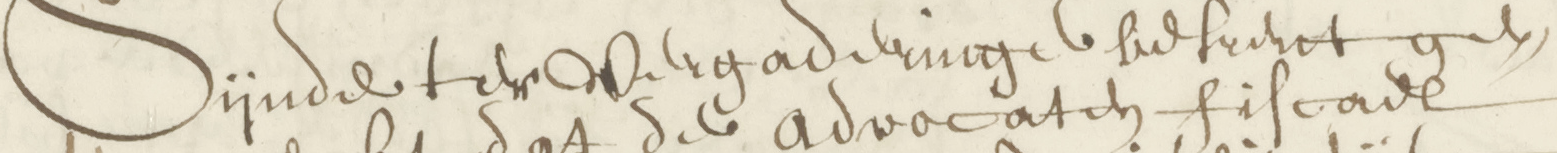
Sijnde ter Vergaderinge bekent ge„
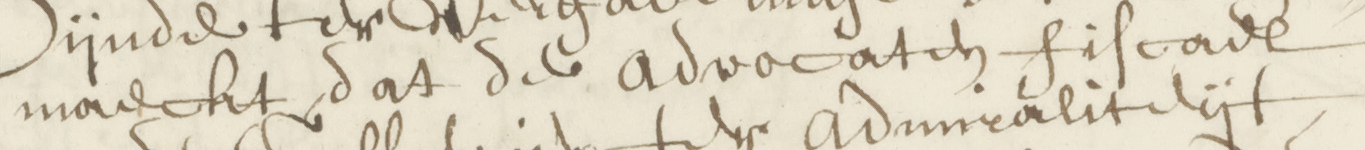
maeckt, dat de Advocaten fiscael
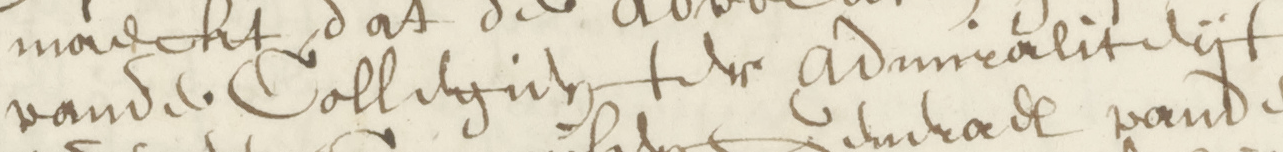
vande Collegien ter Admiraliteijt
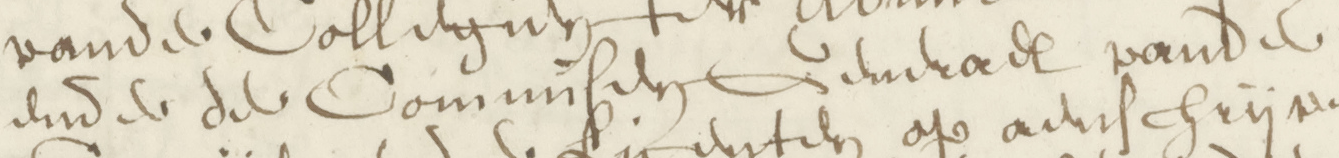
ende de Commisen Generael vande
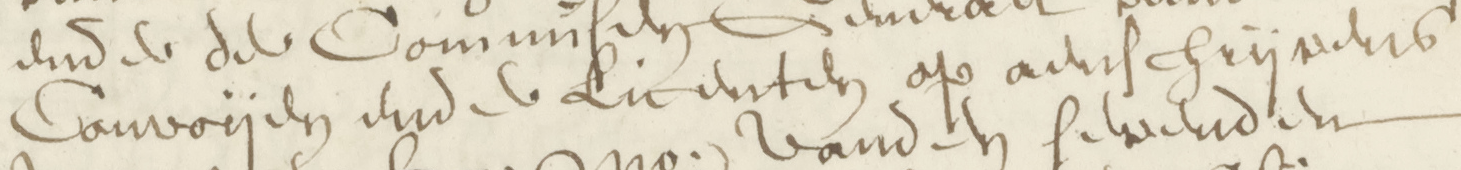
Convoijen ende Licenten op aenschrijvens
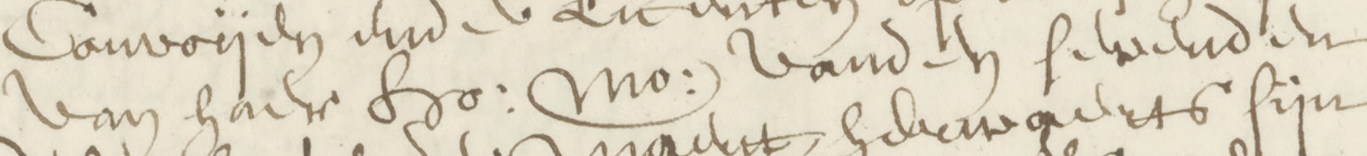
van haer Ho:Mo: vanden sevenden
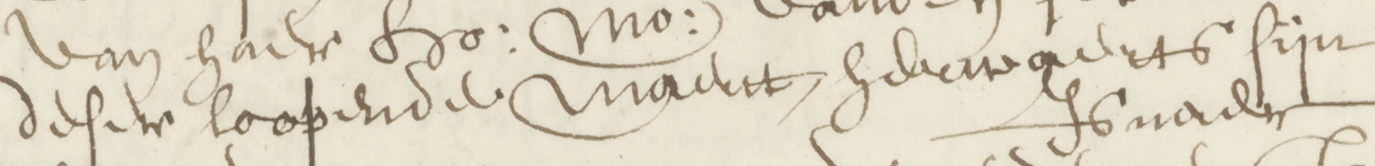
deser loopende maent, herwaerts sijn
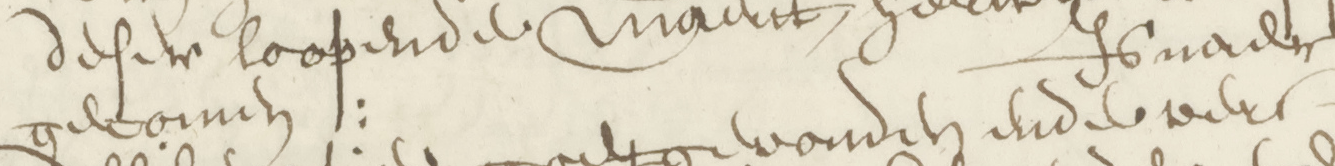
gecomen: Is naer
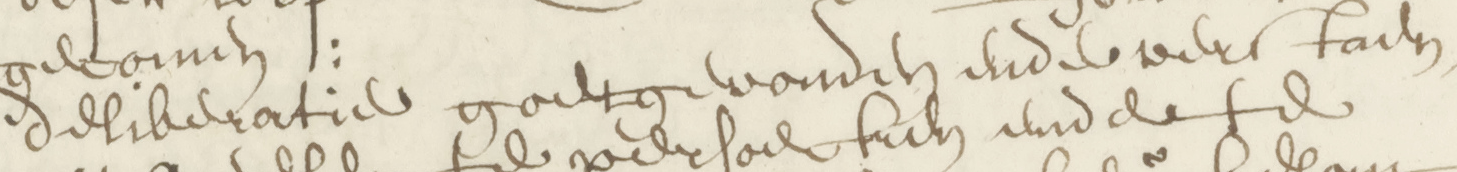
deliberatie goetgevonden ende verstaen,
